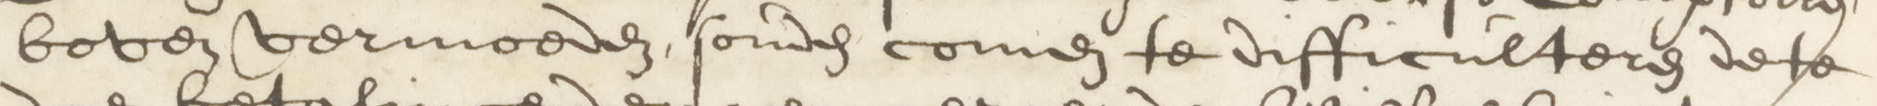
boven vermoeden, souden comen te difficulteren de te
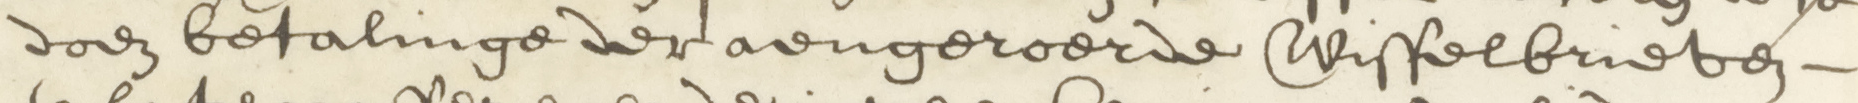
doen betalinge der aengeroerde Wisselbrieven —
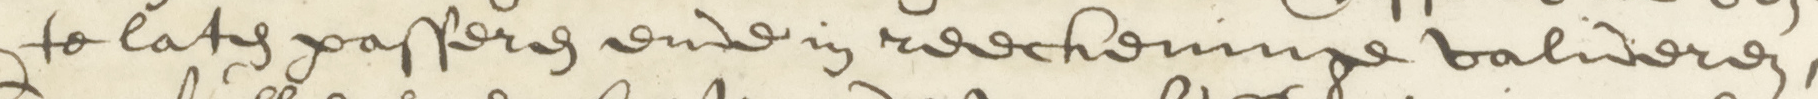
te laten passeren ende in reeckeninge valideren,
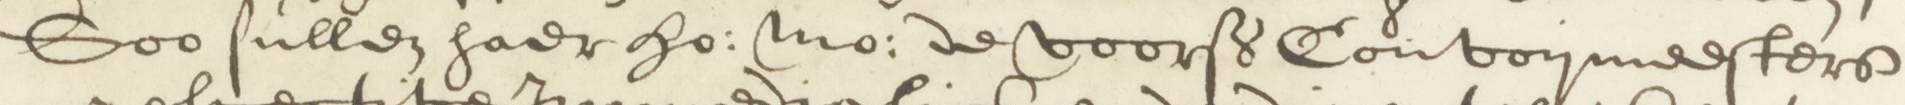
Soo sullen haer Ho:Mo: de voors Convoijmeesters
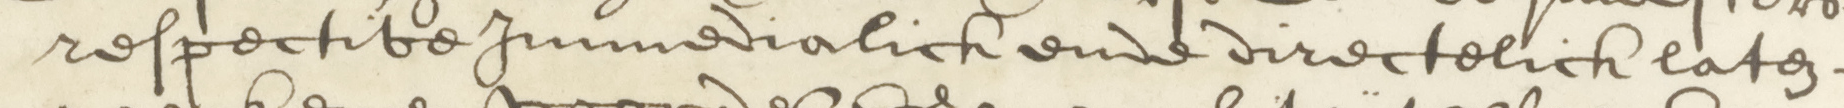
respective Immedialick ende directelick laten
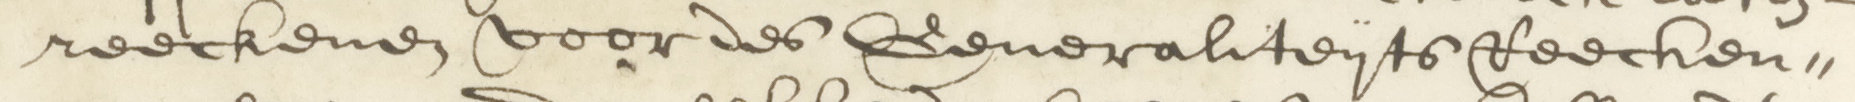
reeckenen voor des Generaliteijts Reecken„
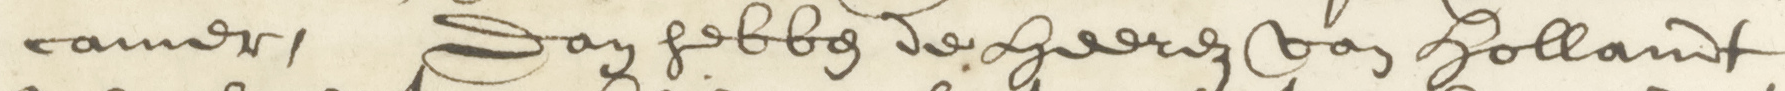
camer. Dan hebben de Heeren van Hollandt
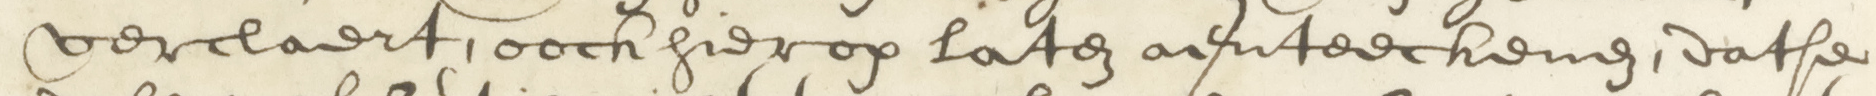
verclaert, oock hierop laten aenteeckenen, datse
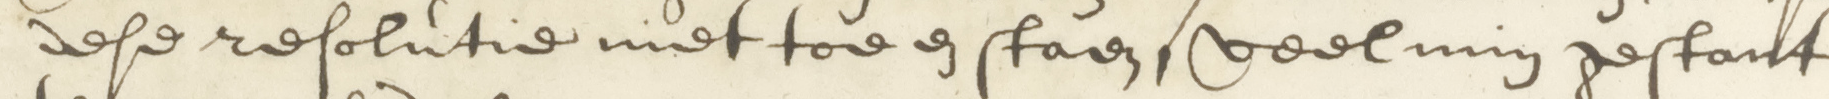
dese resolutie niet toe en staen, veel min gestant
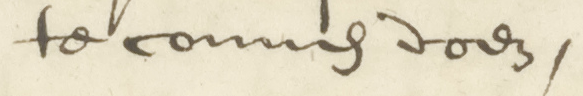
te connen doen.
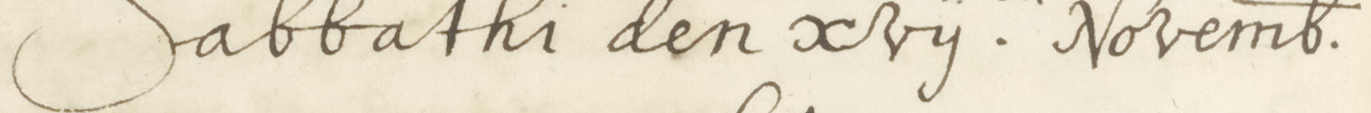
Sabbathi den xvijen. Novemb.
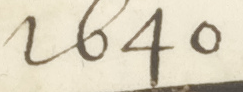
1640
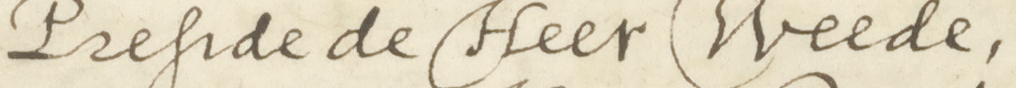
Preside de Heer Weede,
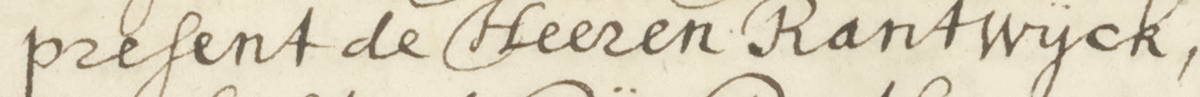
present de Heeren Rantwijck,
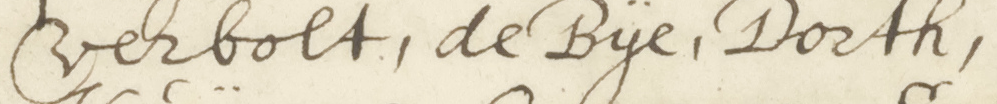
Verbolt, de Bije, Dorth,
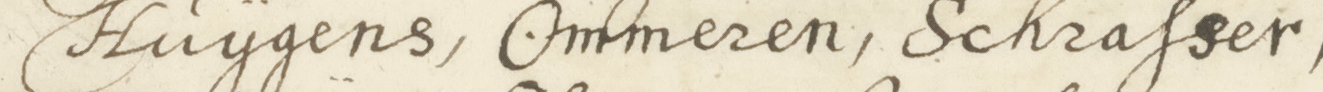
Huijgens, Ommeren, Schrasser,
